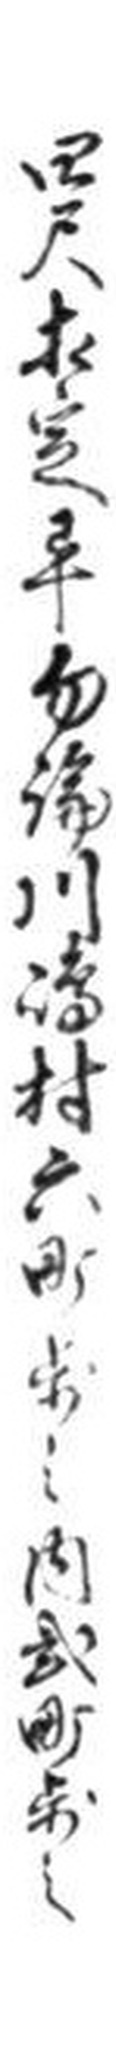四尺相定畢勿論川嶋村六町歩之内弐町歩之
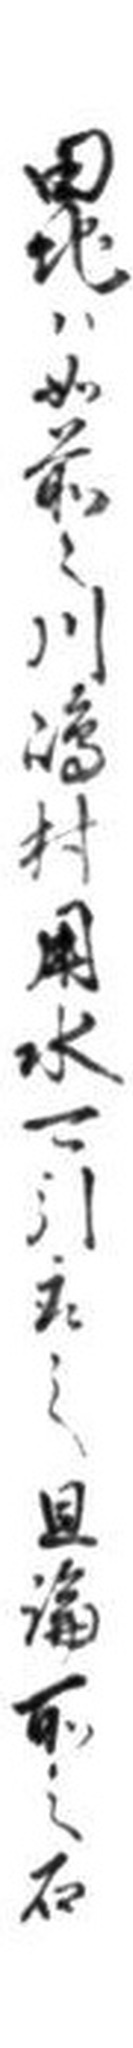田地ハ如前々川嶋村用水可引取之且論所之石
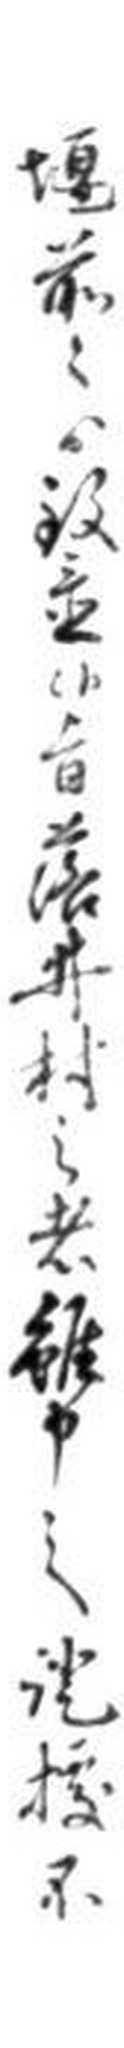堰前々ゟ致置候旨落井村之者雖申之証拠不
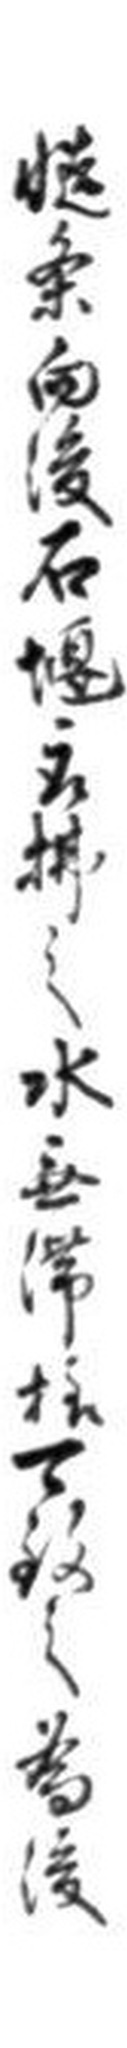慥条向後石堰取払之水無滞様可致之為後
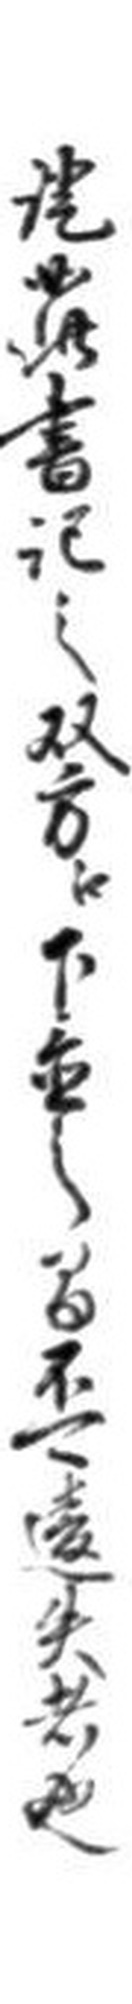証如此書記之双方江下置之間不可違失者也
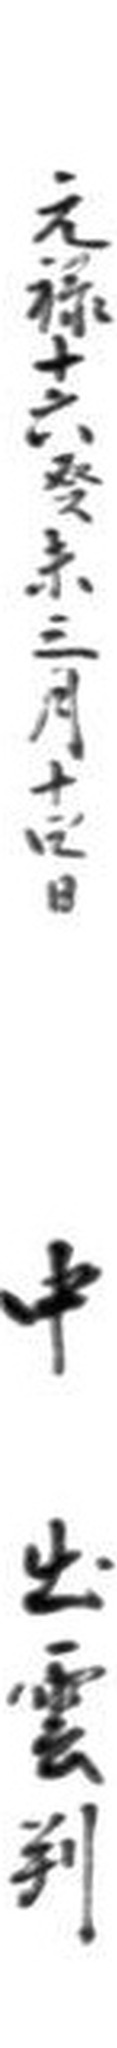元禄十六癸未三月十四日中出雲判
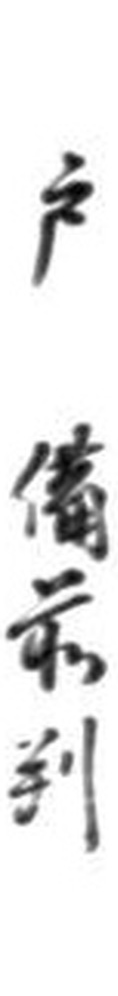戸備前判
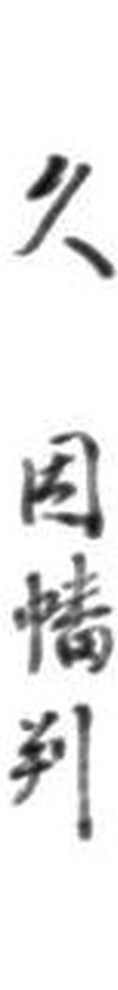久因幡判
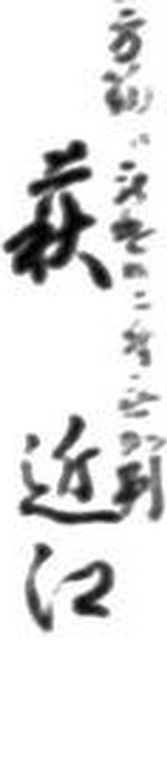萩近江
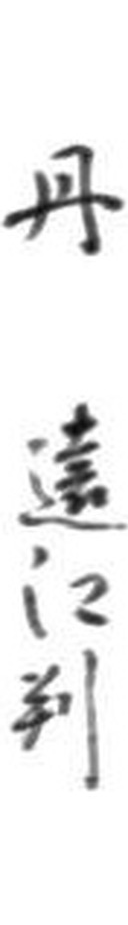丹遠江判
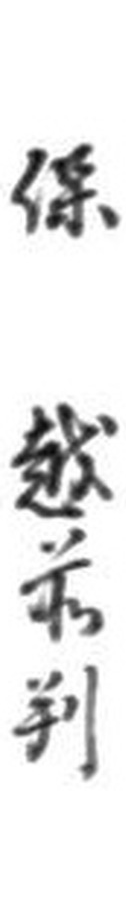保越前判
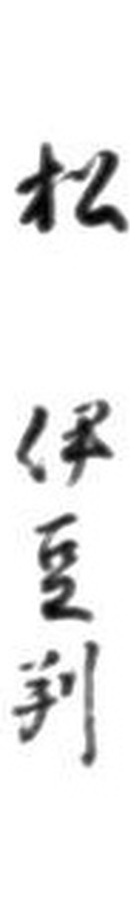松伊豆判
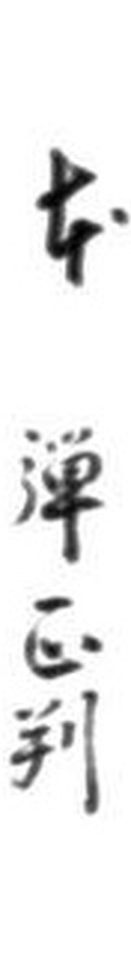本弾正判

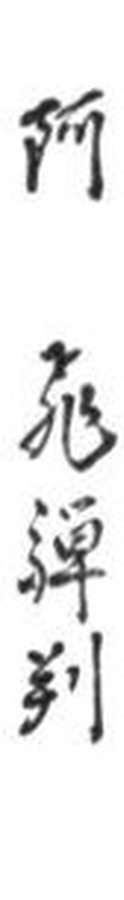阿飛騨判
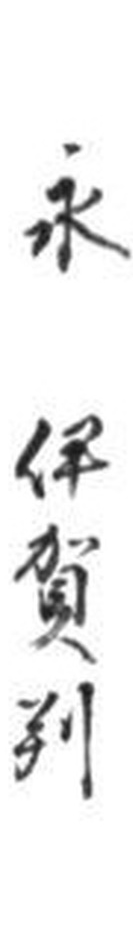永伊賀判
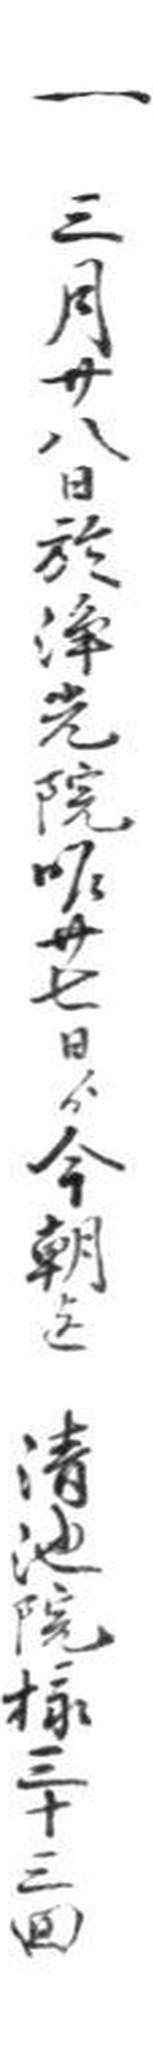一三月廿八日於浄光院昨廿七日ゟ今朝迄清池院様三十三回
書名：家譜 二十二 吉品公 従元禄十五年到同十六年
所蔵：福井県文書館 Fukui Prefectural Archives
